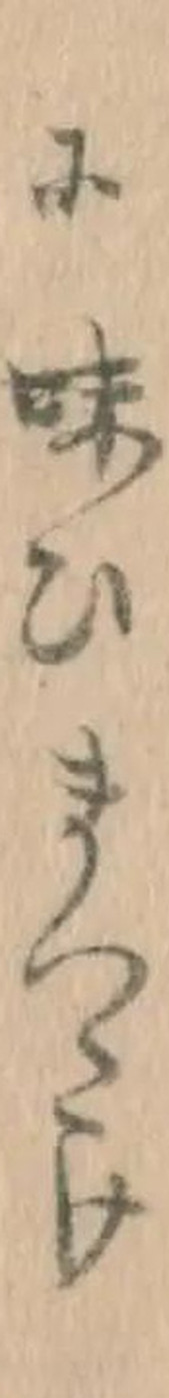に味ひまつたけ
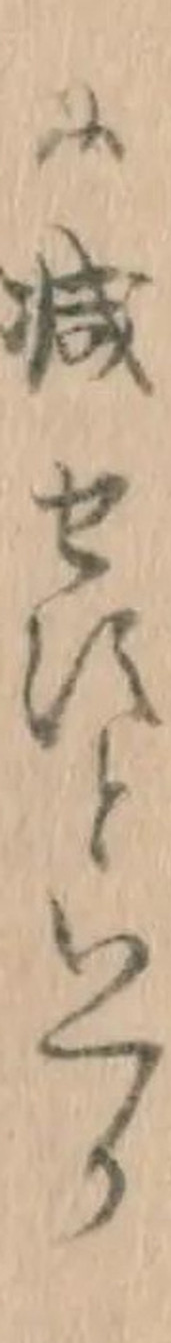に減せすといへり
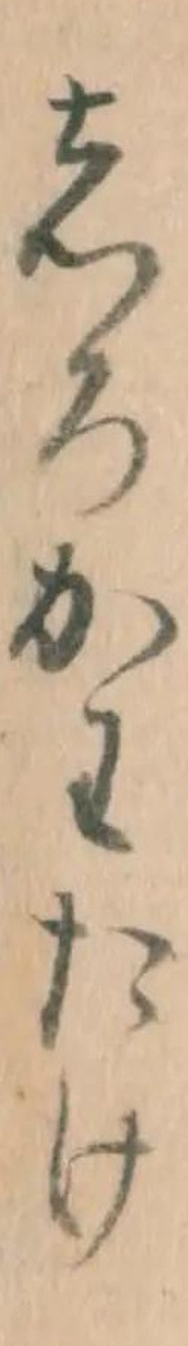しろかわたけ
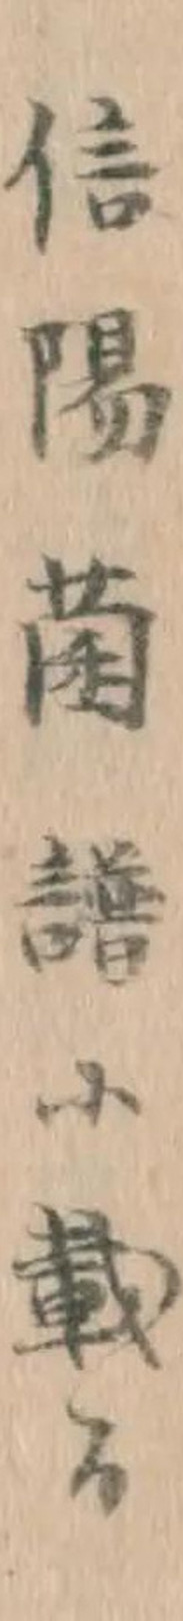信陽菌譜に載る
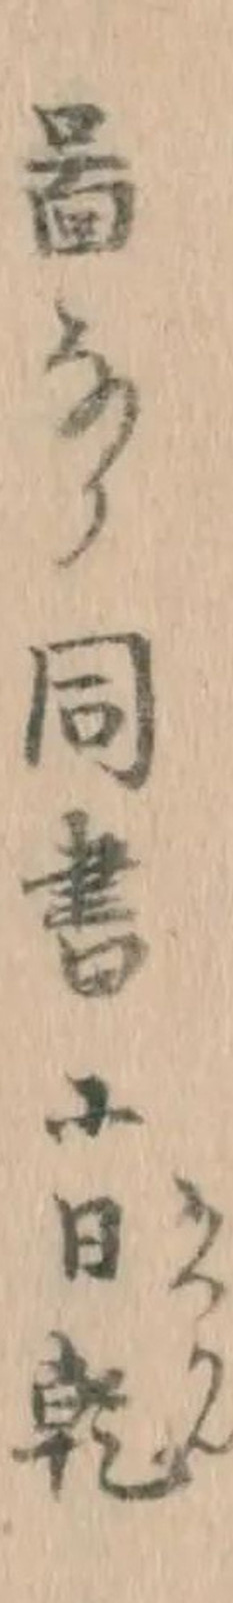図なり同書に日乾
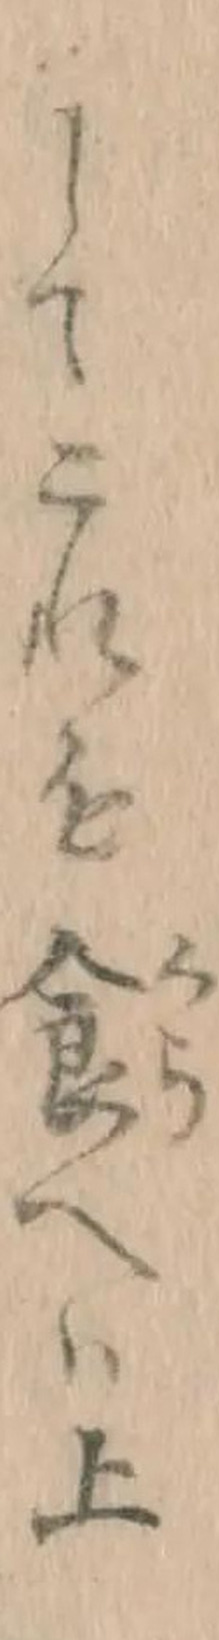してこれを食へは上
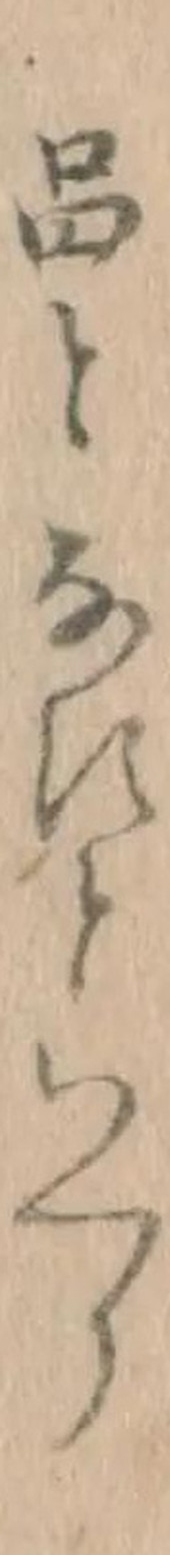品となすといへり
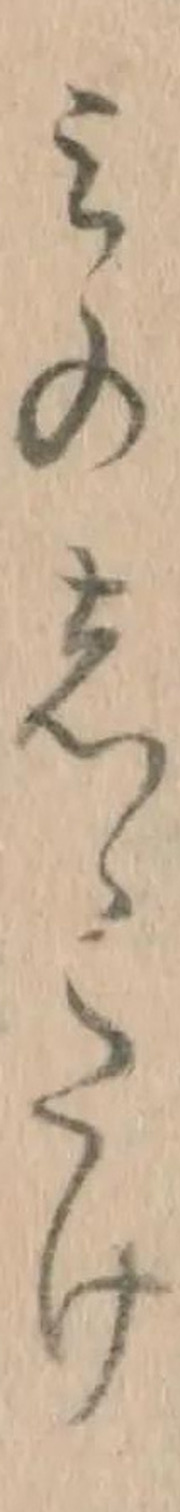みのしゝたけ
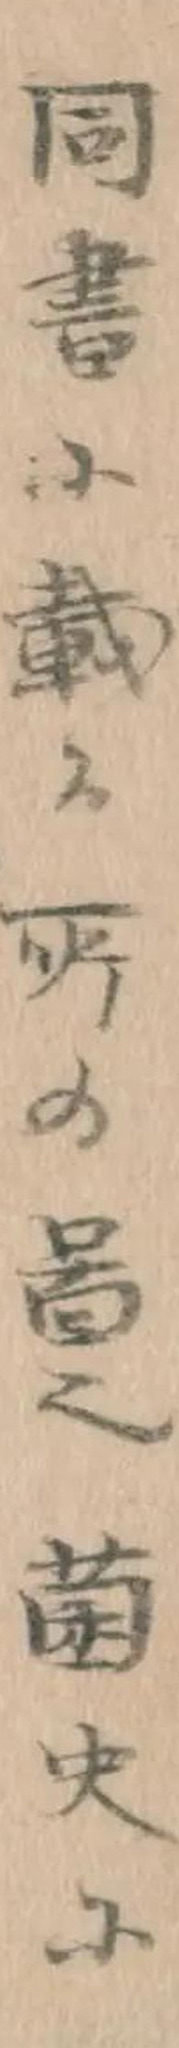同書に載る所の図也菌史に
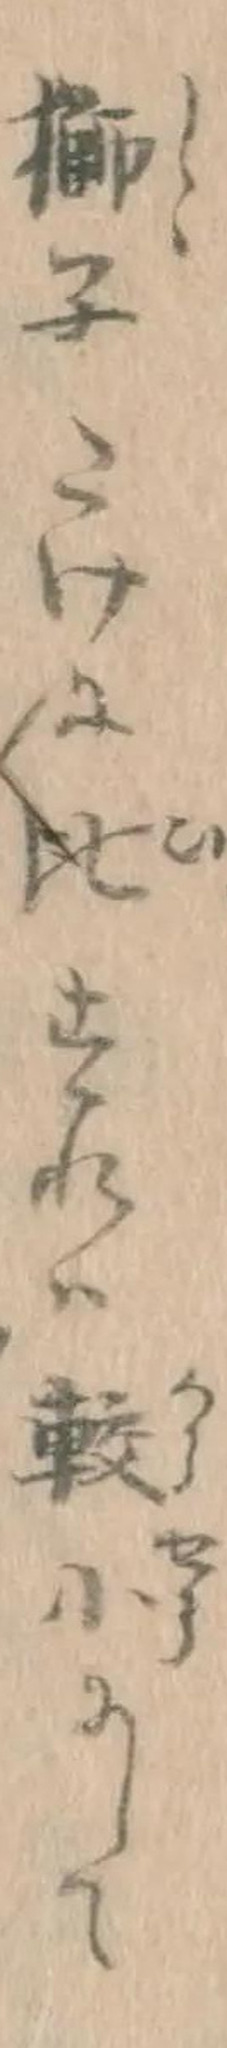獅子たけに比すれは較小にして
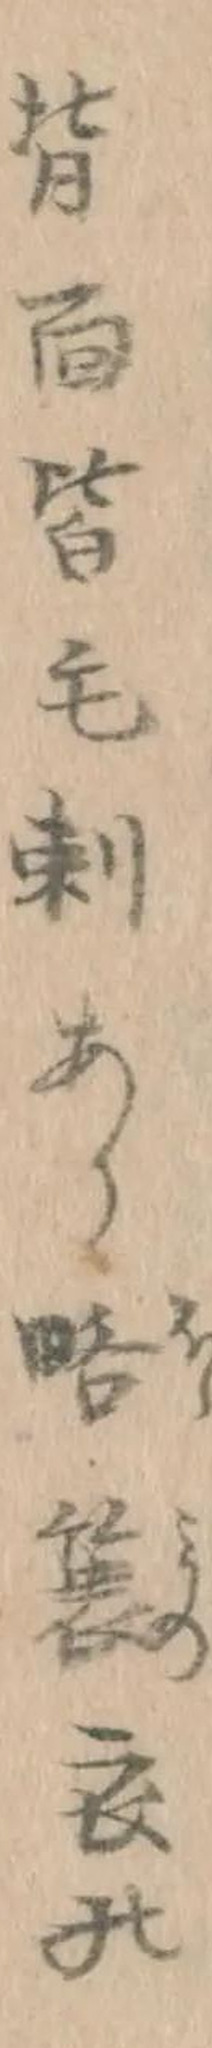背面皆毛剌あり略簑衣の
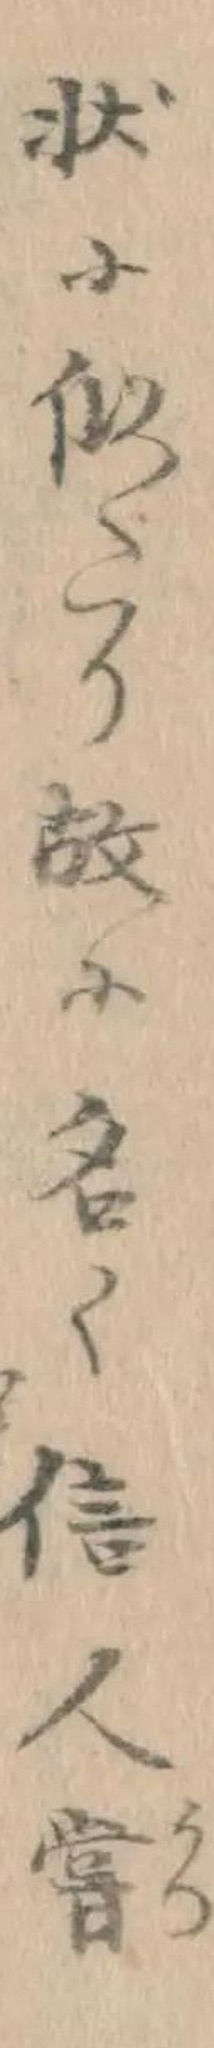状に似たり故に名く信人嘗
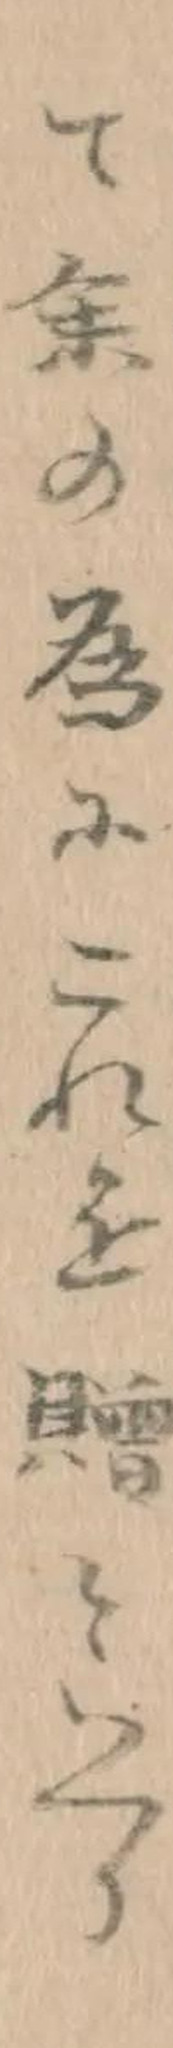て余の為にこれを贈といへり

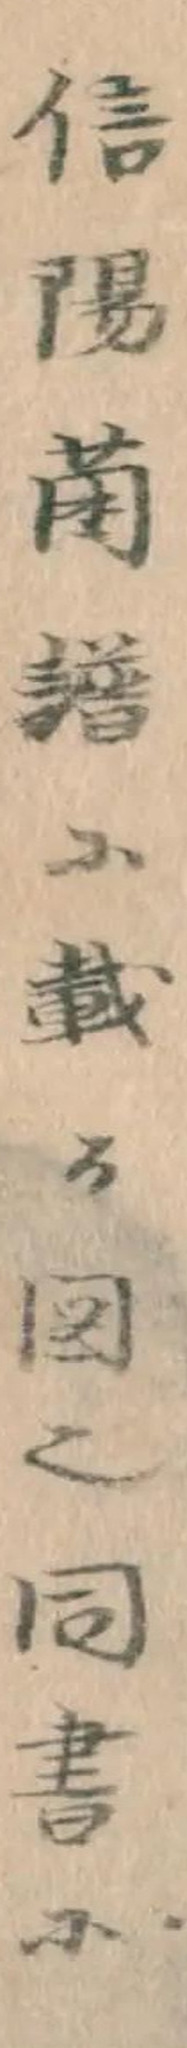信陽菌譜に載る図也同書に
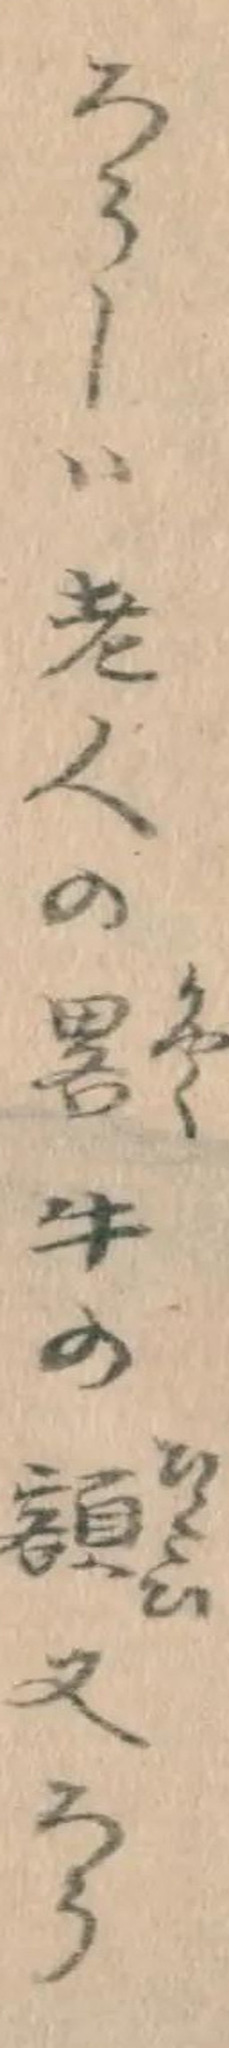ろうしは老人の略牛の額又ろう
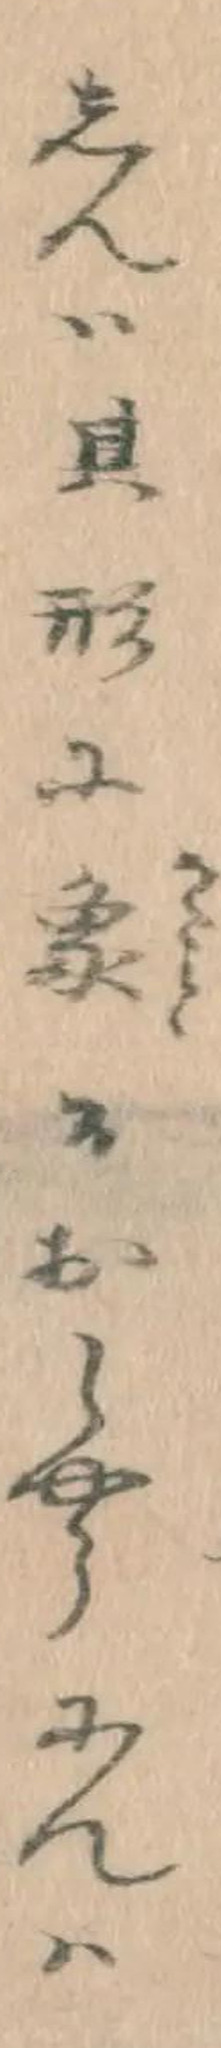しんは其形に象るおしやうにんは
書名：本草図譜. 巻55-57
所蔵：国立国会図書館 National Diet Library, JAPAN
